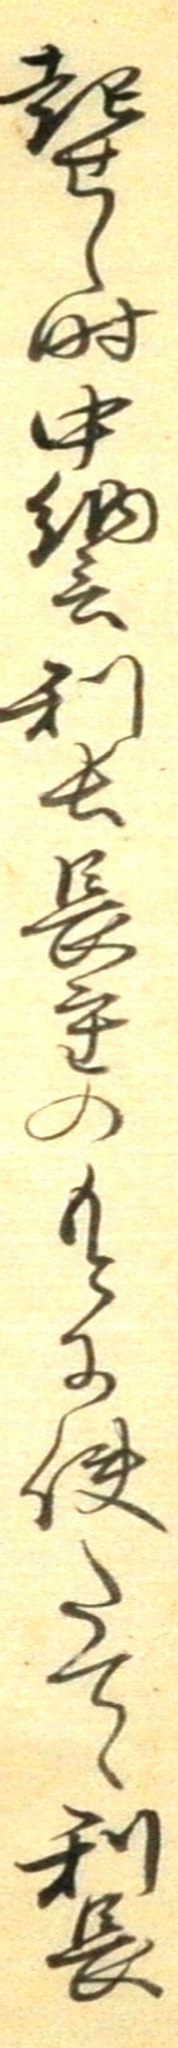起せし時中納言利長長重のもとに使たてゝ利長
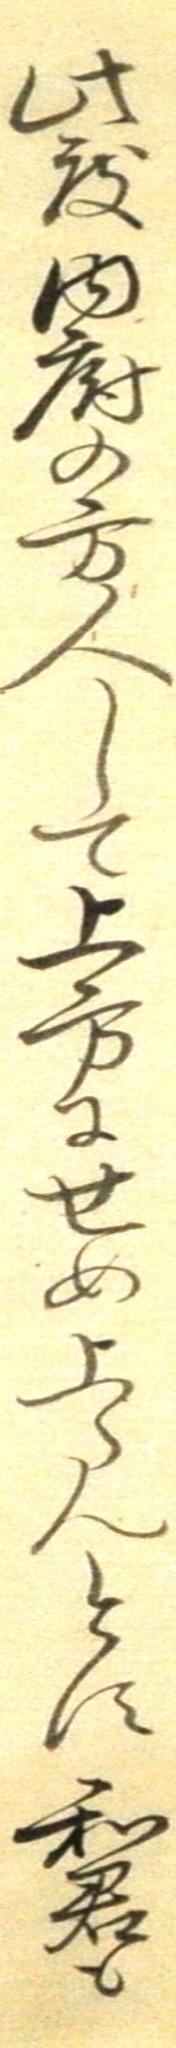此度内府の方人して上方にせめ上らんとす和君も
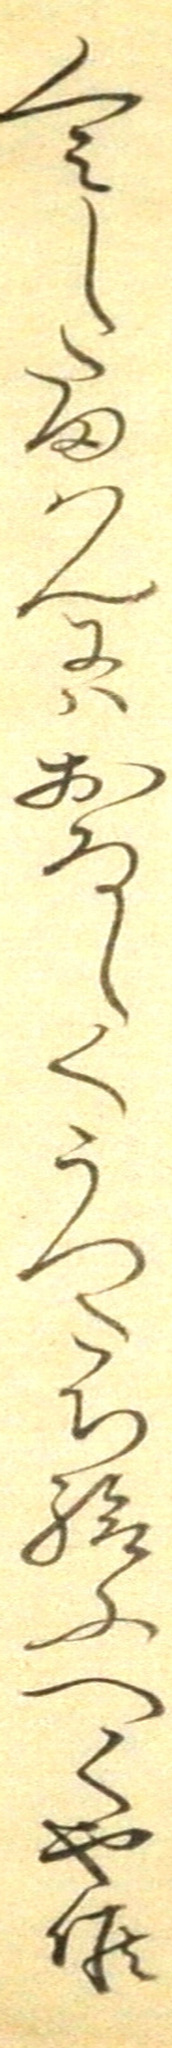くみしたまはんにはおなしくうつたち給ふへくや候
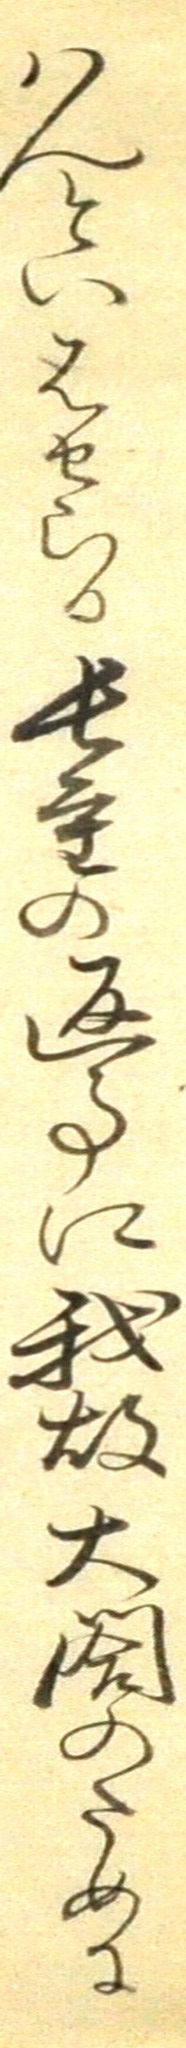はんといはせらる長重の返事に我故太閤のために
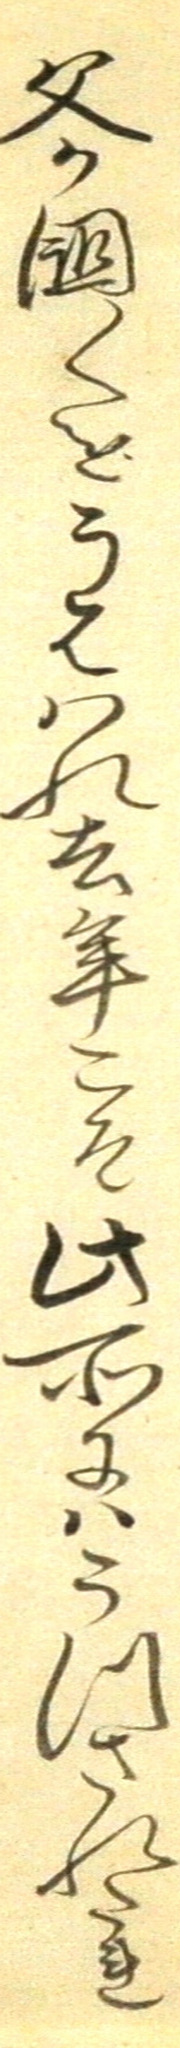父か国〳〵をうははれ去年こそ此所にはうつされたれ
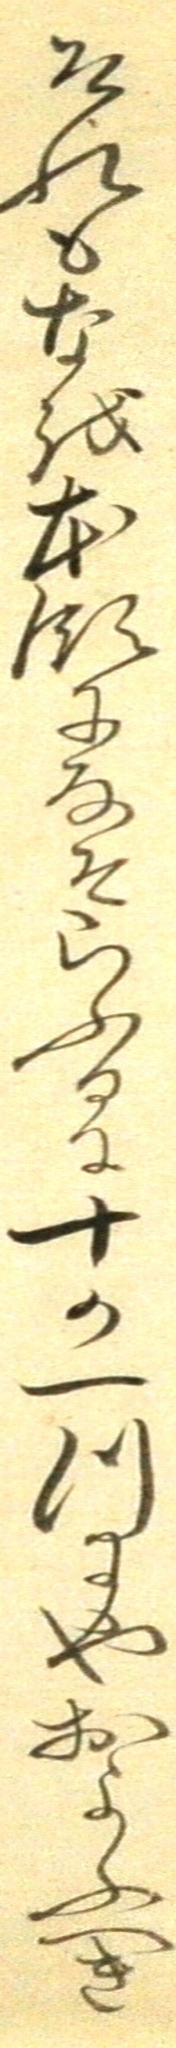それもなを本領になそらふるに十の一つにやおよふへき
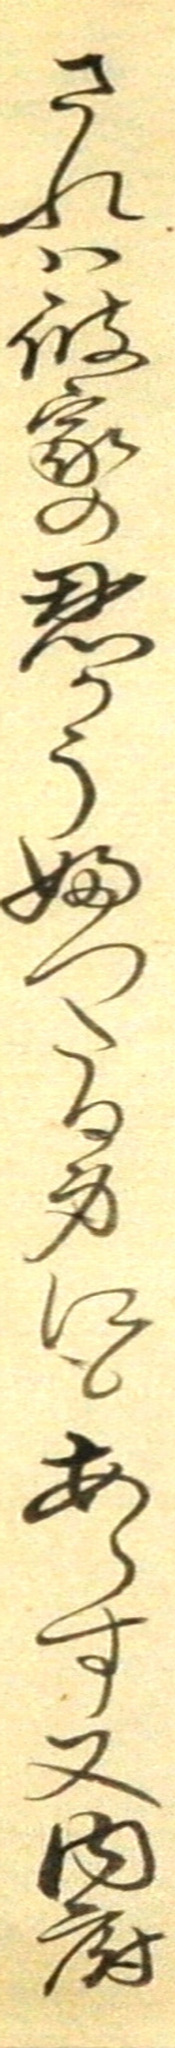されは彼家の恩かうふつたる身にもあらす又内府
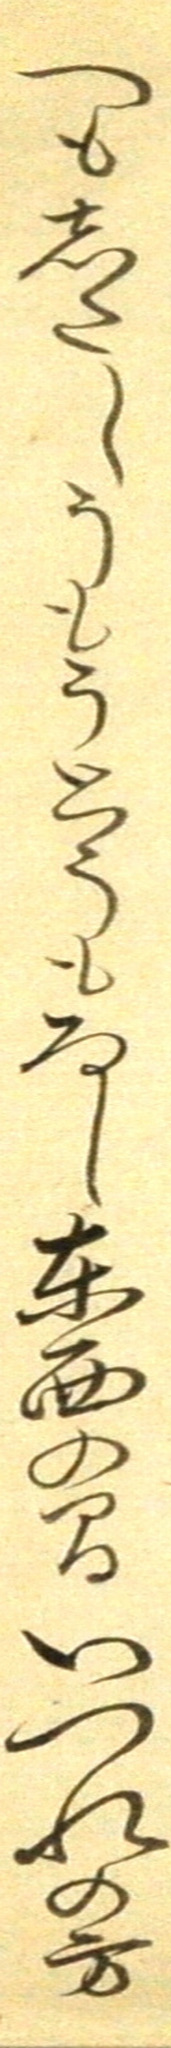へもしたしうもうとうもなし東西の間いつれの方
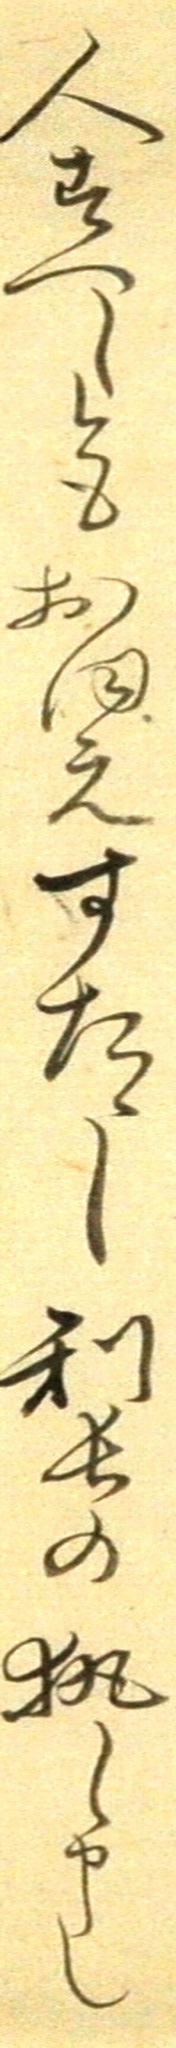人すへしともおほえすたゝし利長の執し申し
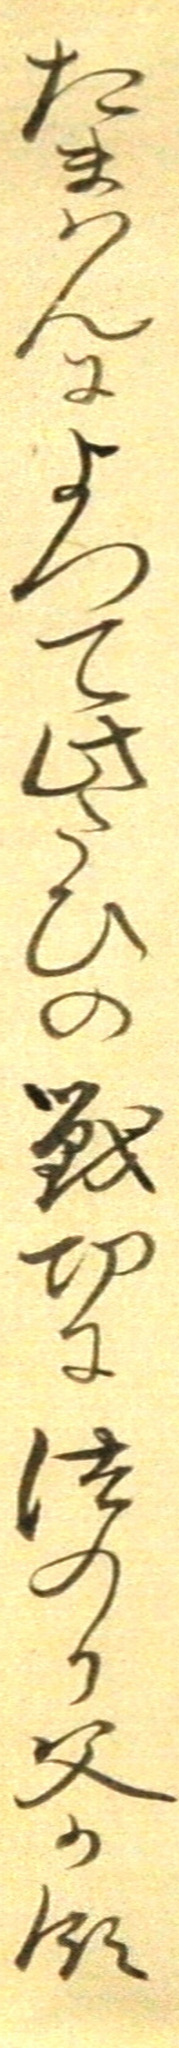たまはんによつて此たひの戦功につのり父か領

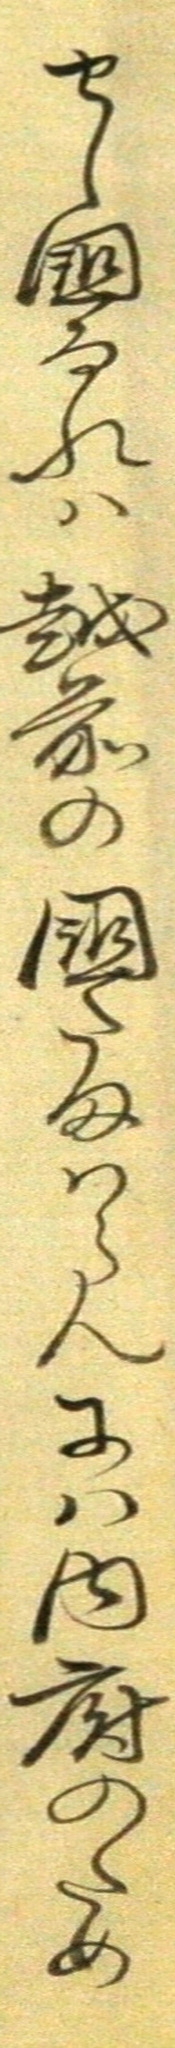せし国なれは越前の国たまはらんには内府のため
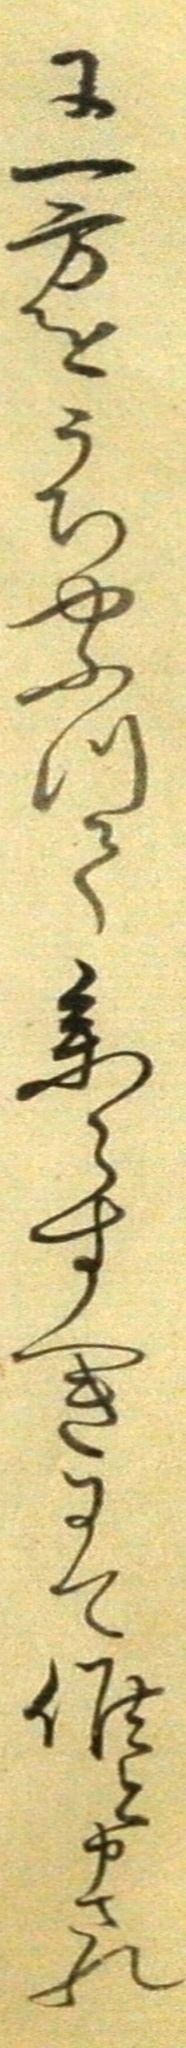に一方をうちやふつて参らすへきにて候と申され
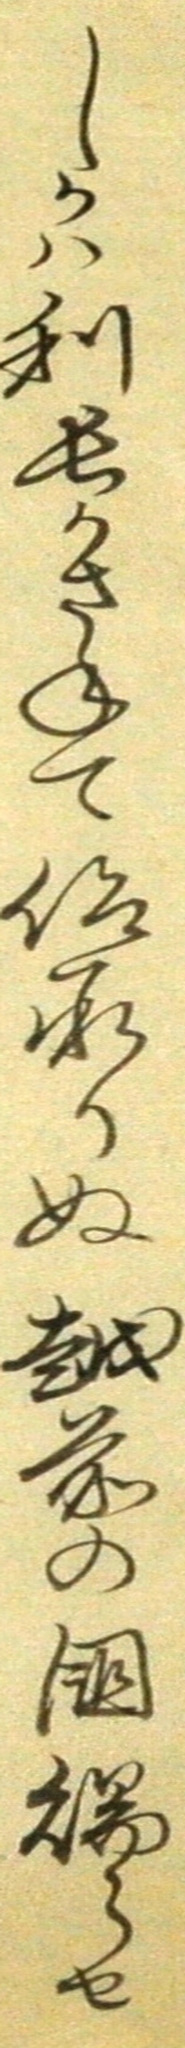しかは利長かさねて仰承りぬ越前の国賜らせ
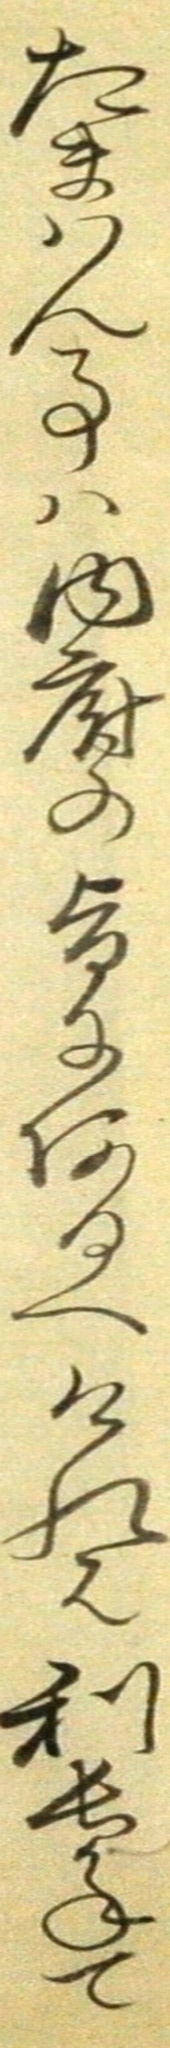たまはん事は内府の旨にあるへけれは利長かねて
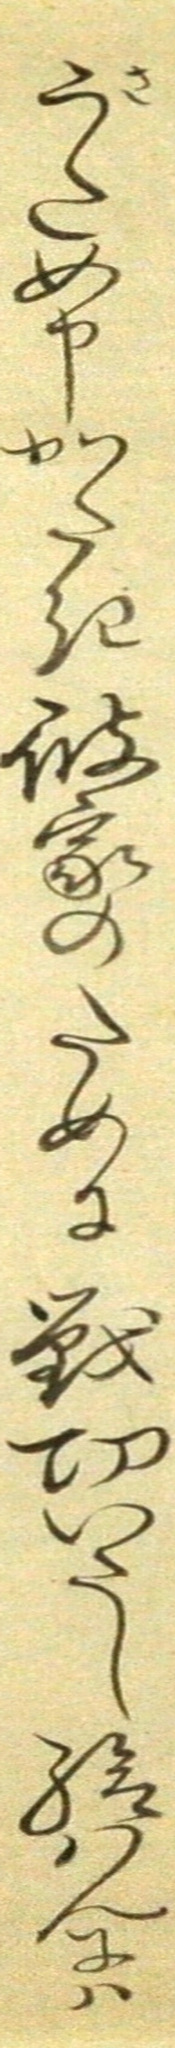うため申かたき彼家のために戦功いたし給はんには
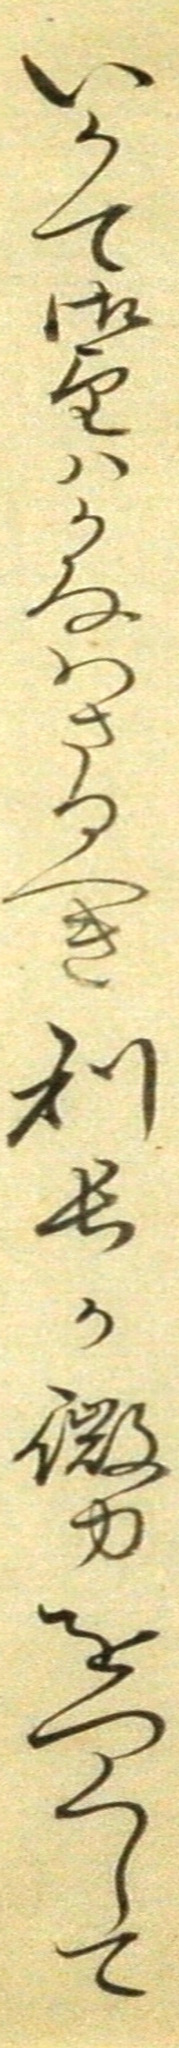いかて御望はかなはさるへき利長か微力をつくして
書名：藩翰譜（八・下）
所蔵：伊那市立高遠町図書館・合同会社AMANE
